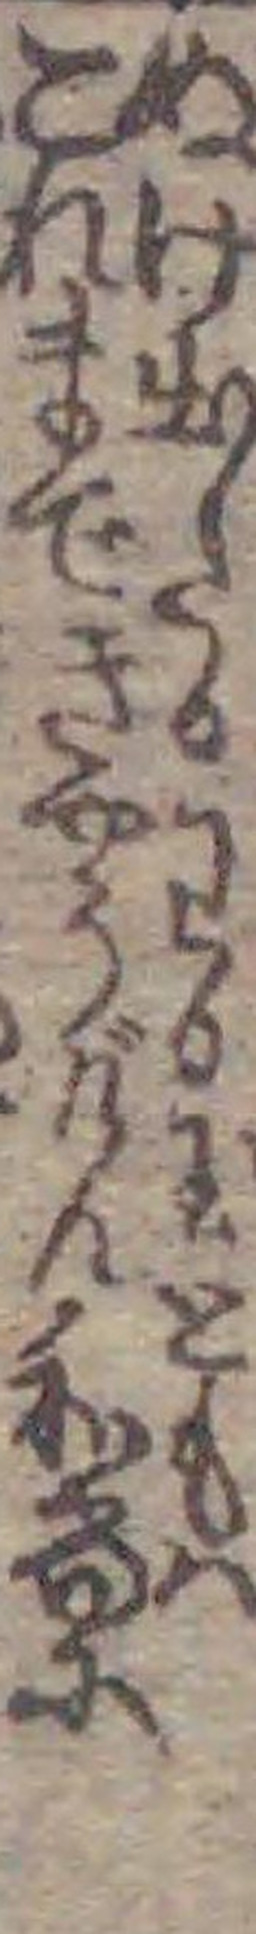これまできやうげん和尚に
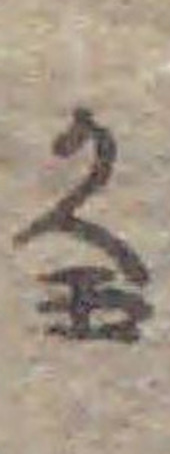かへ玉
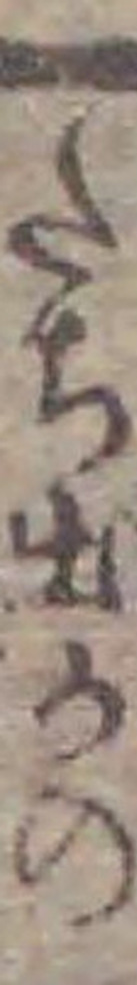たち出かの
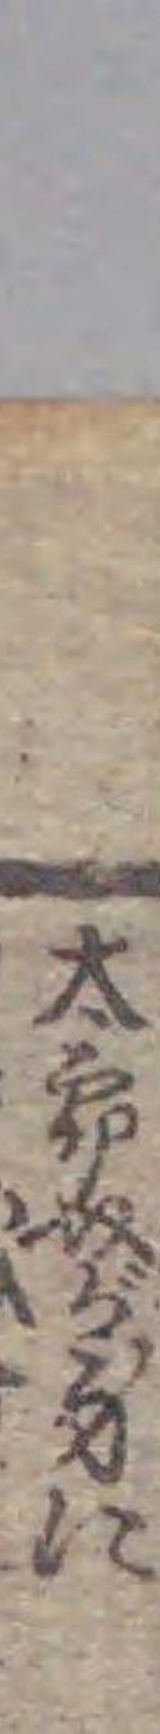太郎介が身に
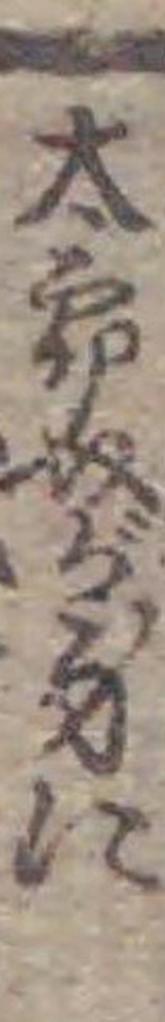太郎介が身に
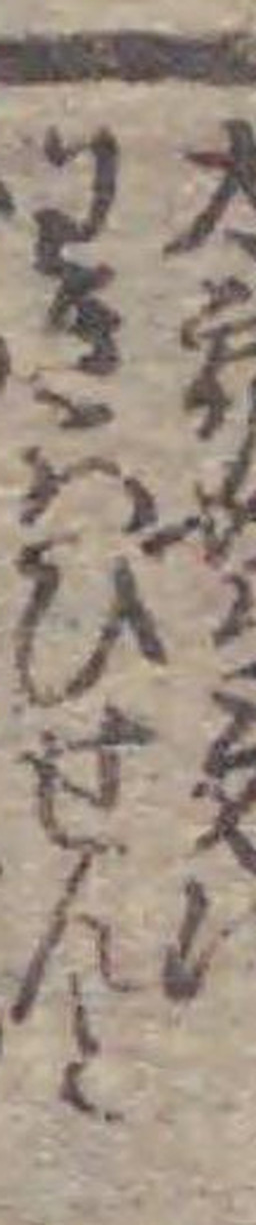わさはひせんと
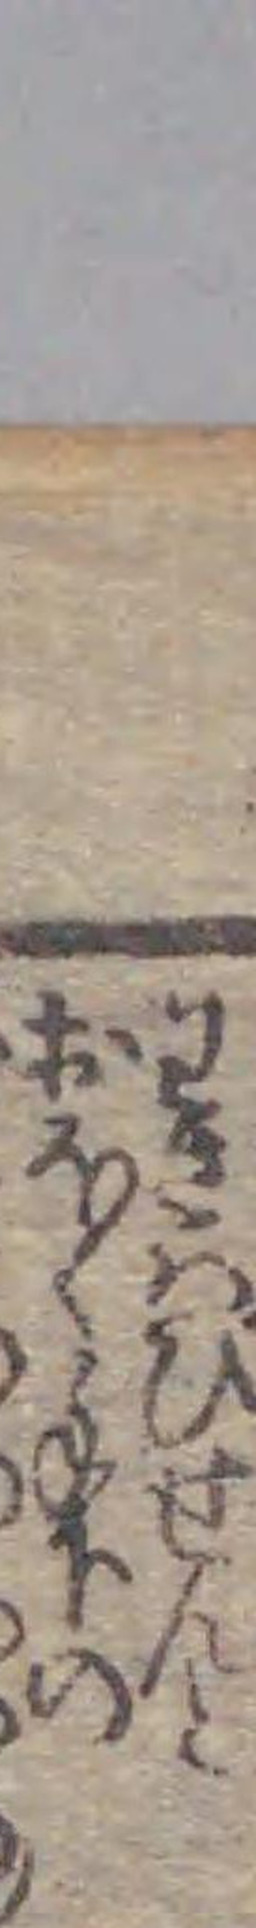おほく手下の
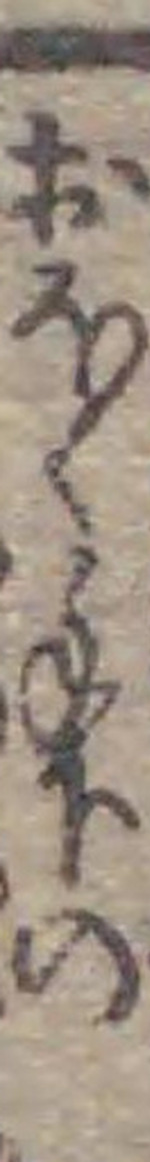おほく手下の
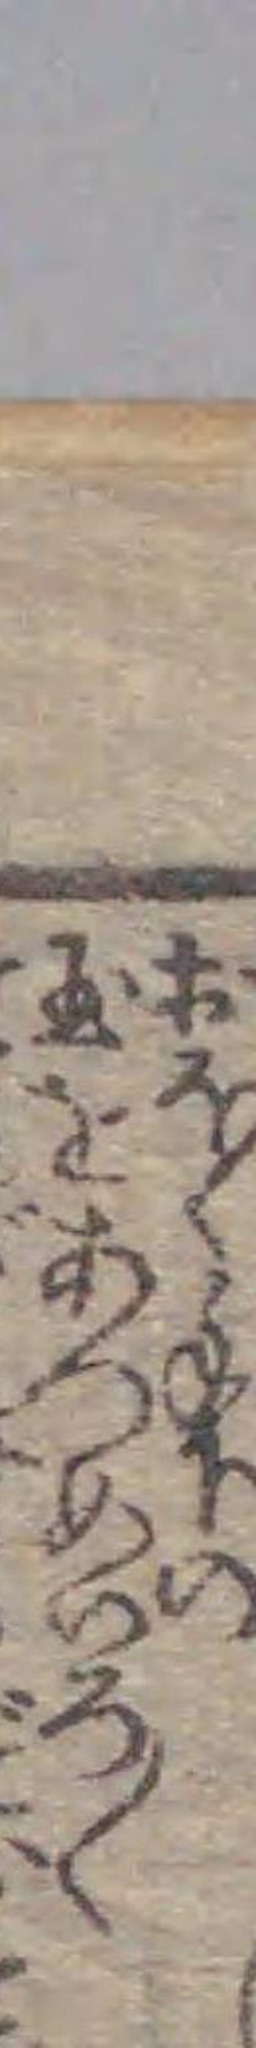玉をあつめいろ〳〵
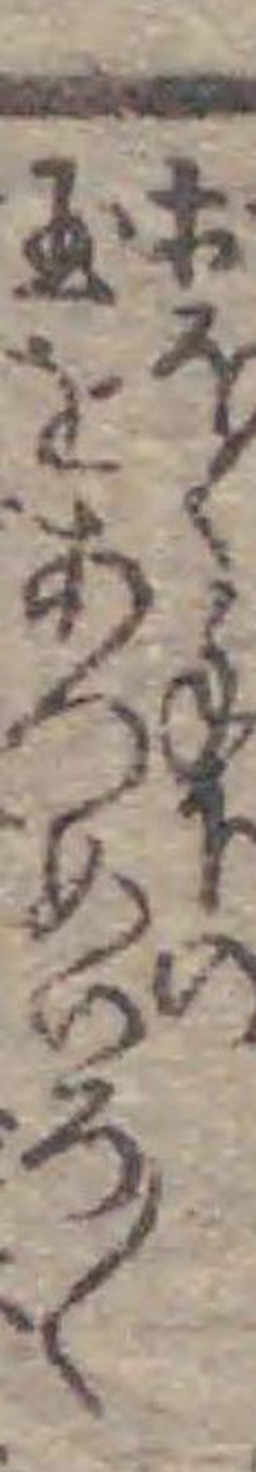玉をあつめいろ〳〵
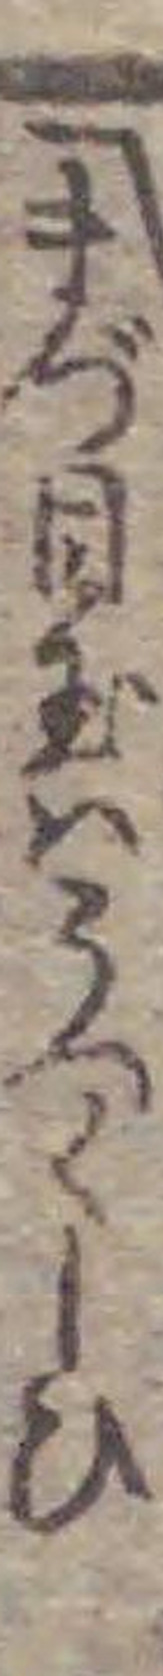〽まづ目玉はうつくしひ
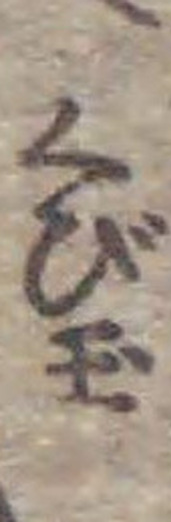くび玉
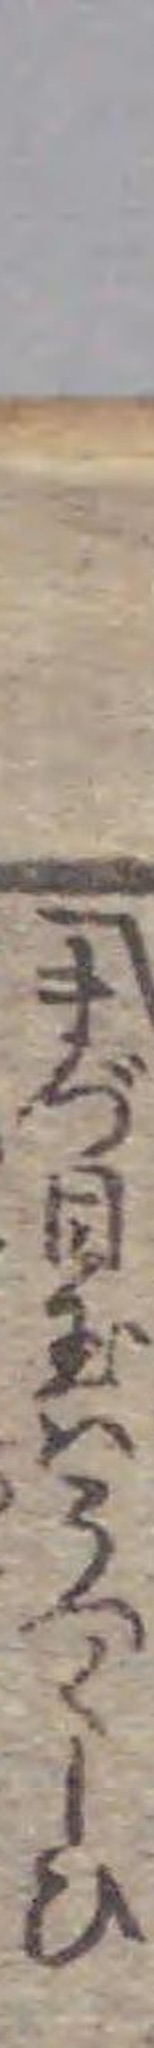〽まづ目玉はうつくしひ
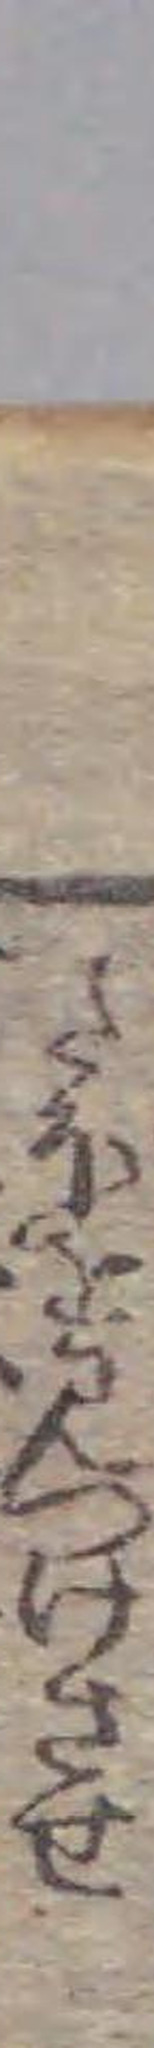たほをみつけさせ
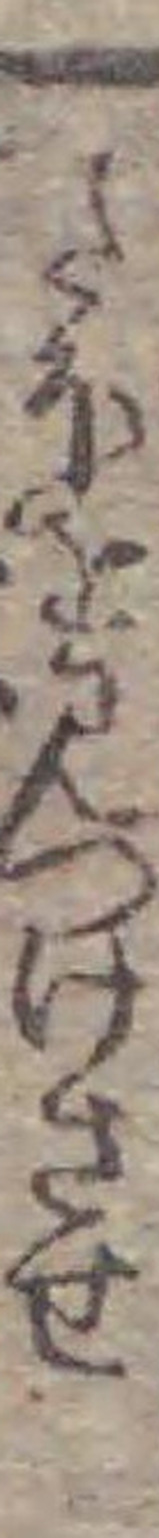たほをみつけさせ
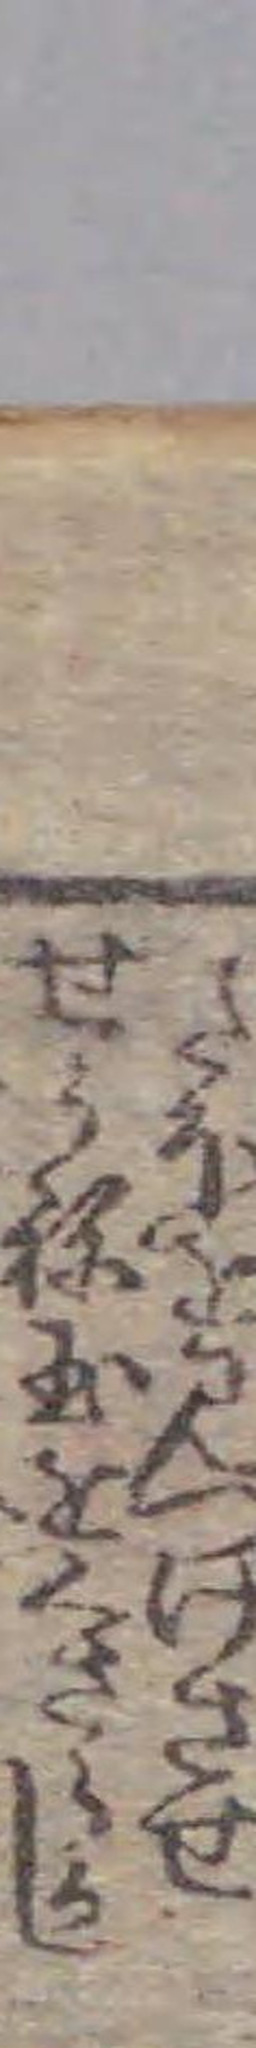せうね玉をくさらかし
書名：四遍搨心学草帋 : 3巻
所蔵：国立国会図書館 National Diet Library, JAPAN
